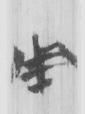用
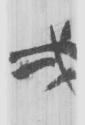{戈一}
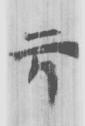元
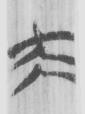夫
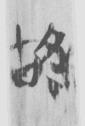{古豕}
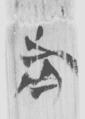{止舟}
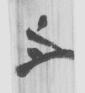之
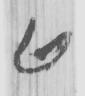㠯（以）
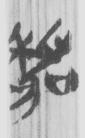嘉
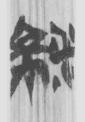{帛㡀}
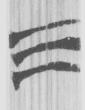三
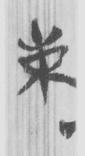束
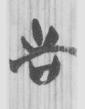告
